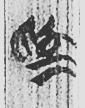爲
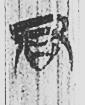君
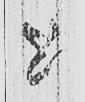也
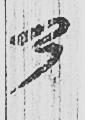乃
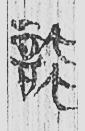{言䖵}
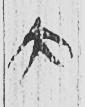大
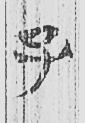子
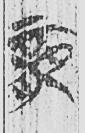龍
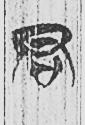君
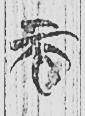而
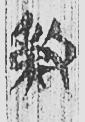殺
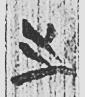之
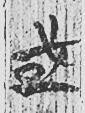或
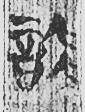{言䖵}
